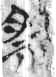祭
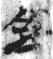室
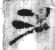之
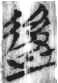後
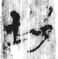垑
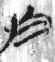於
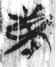東
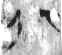北
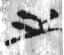之
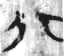北
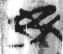𡚦
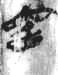窞
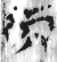凥（居）
